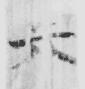亓
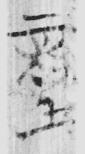童
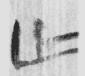亡
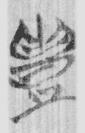豊
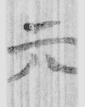亓
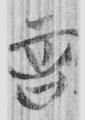言
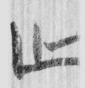亡
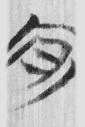宜
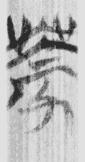{𠅞力}
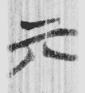亓
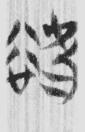欲
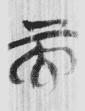而
